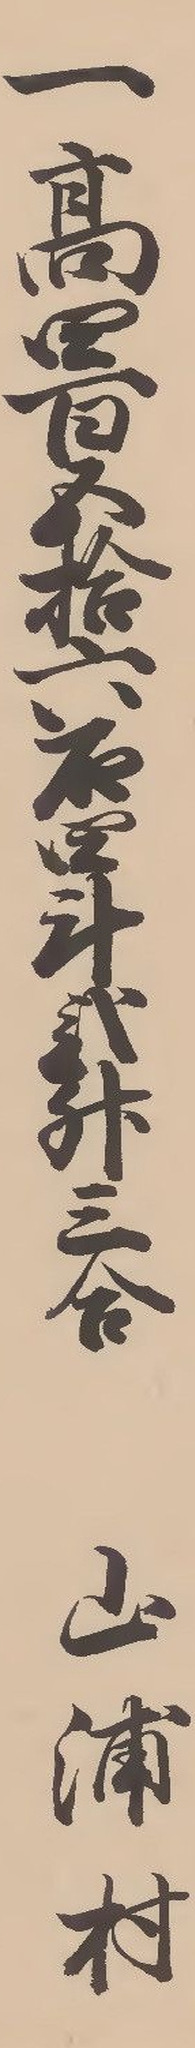一高四百五拾六石四斗弐升三合山浦村
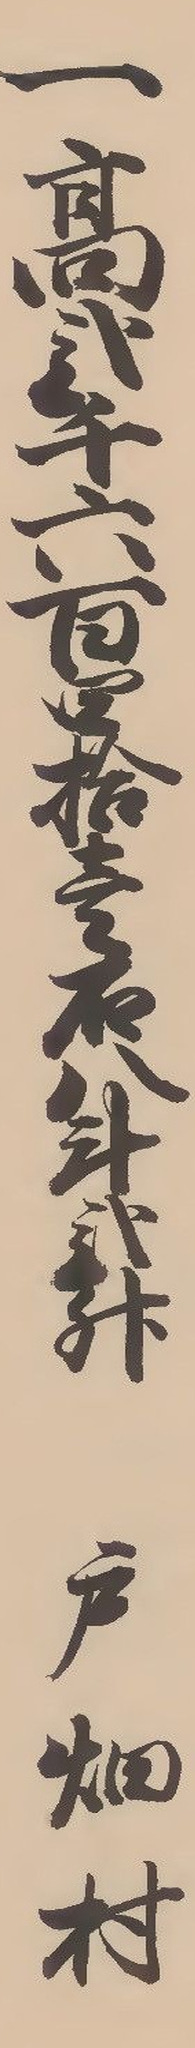一高弐千六百四拾壱石八斗弐升戸畑村
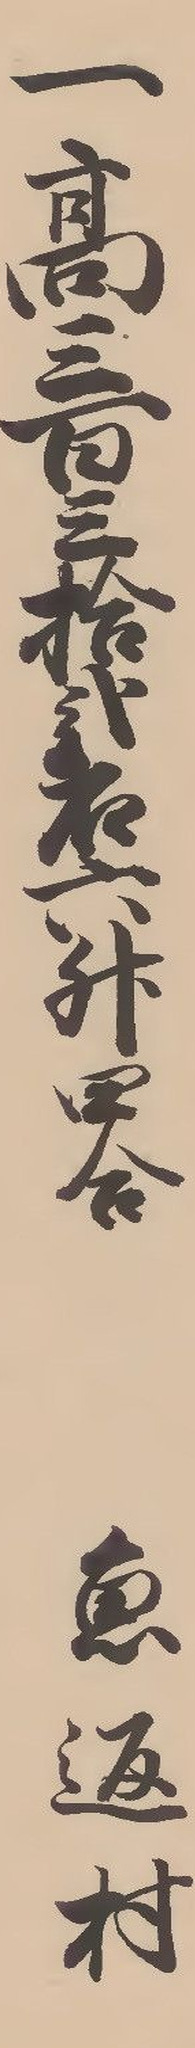一高三百三拾弐石六升四合魚返村
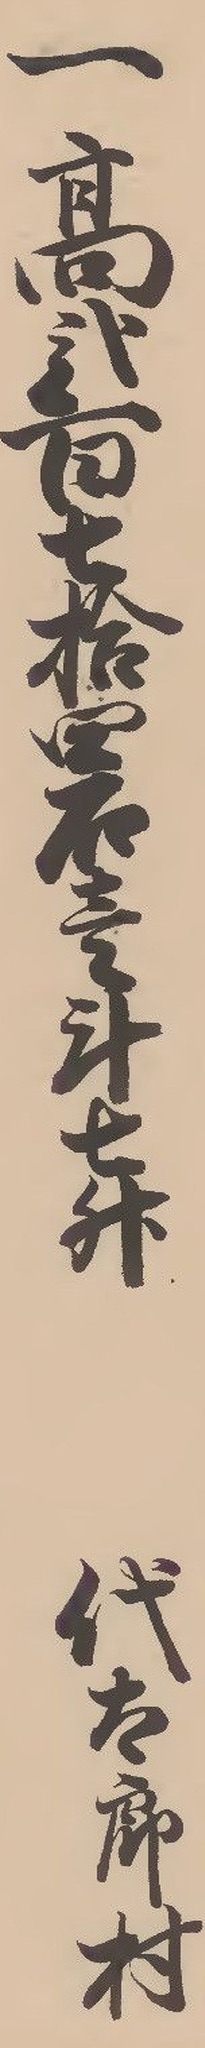一高弐百七拾四石壱斗七升代太郎村

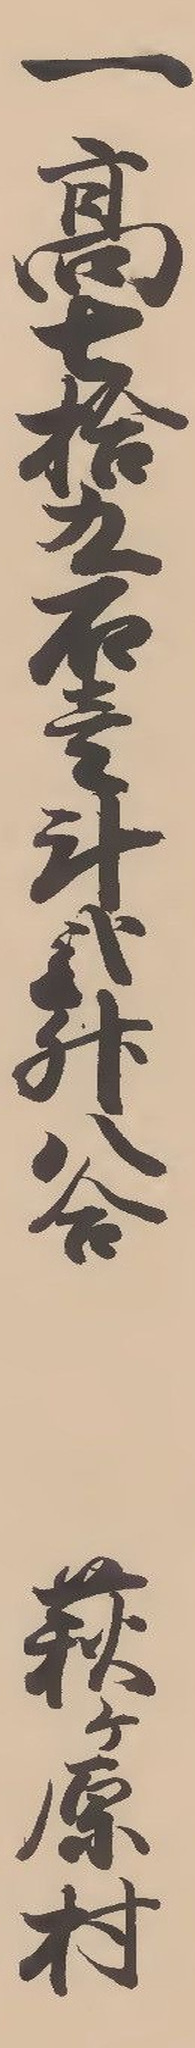一高七拾九石壱斗弐升八合萩ヶ原村
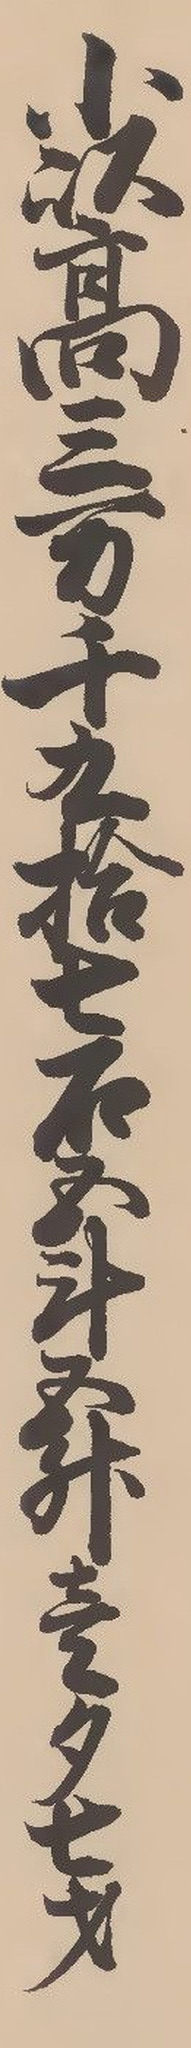小以高三万千九拾七石五斗五升壱勺七才
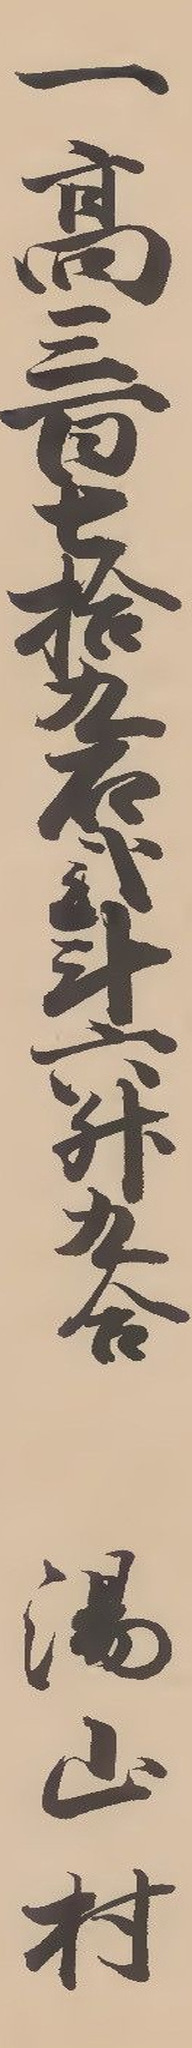一高三百七拾九石弐斗六升九合湯山村

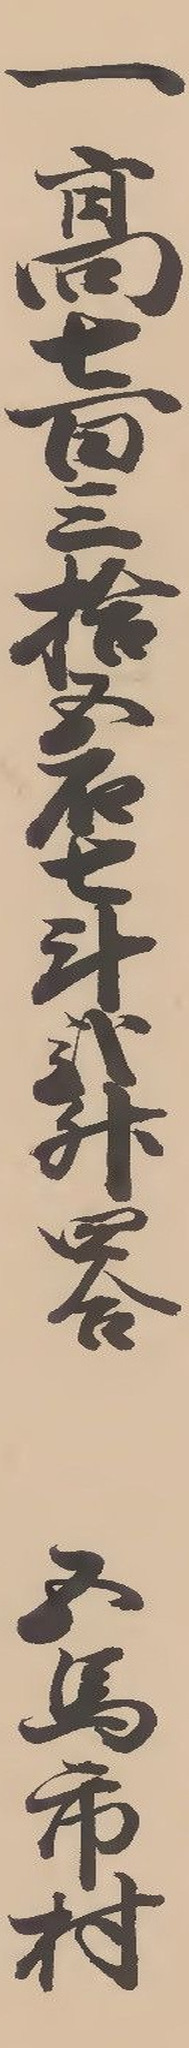一高七百三拾五石七斗弐升四合五馬市村
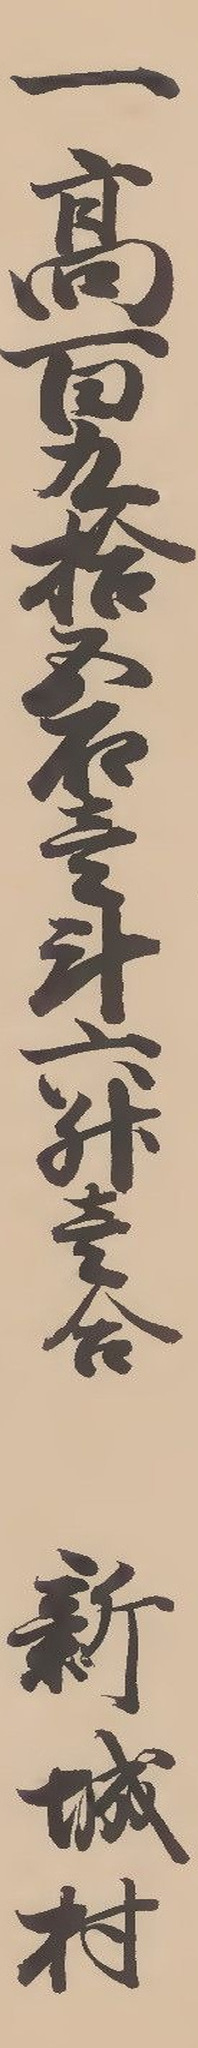一高百九拾五石壱斗六升壱合新城村
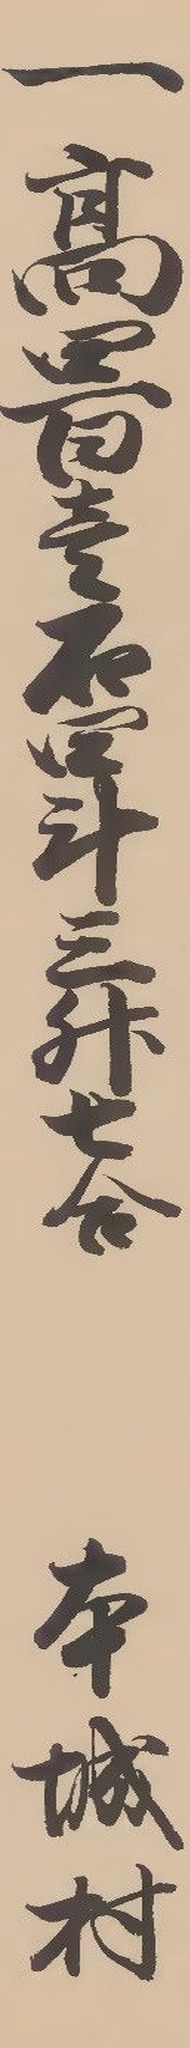一高四百壱石四斗三升七合本城村
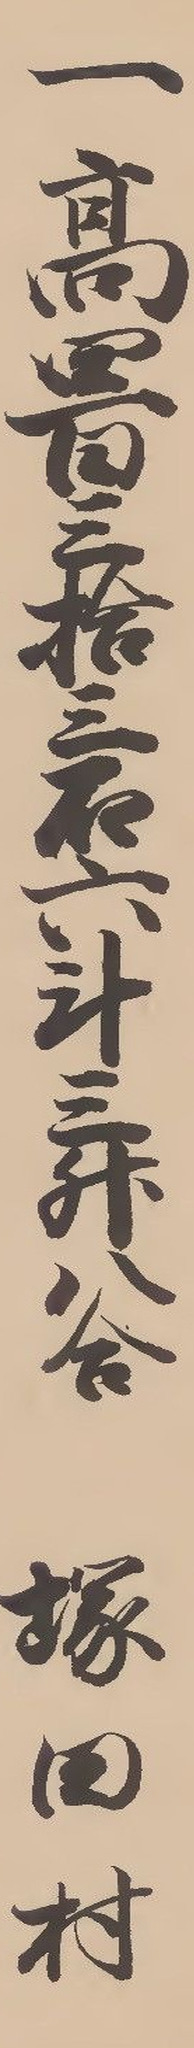一高四百三拾三石六斗三升八合塚田村
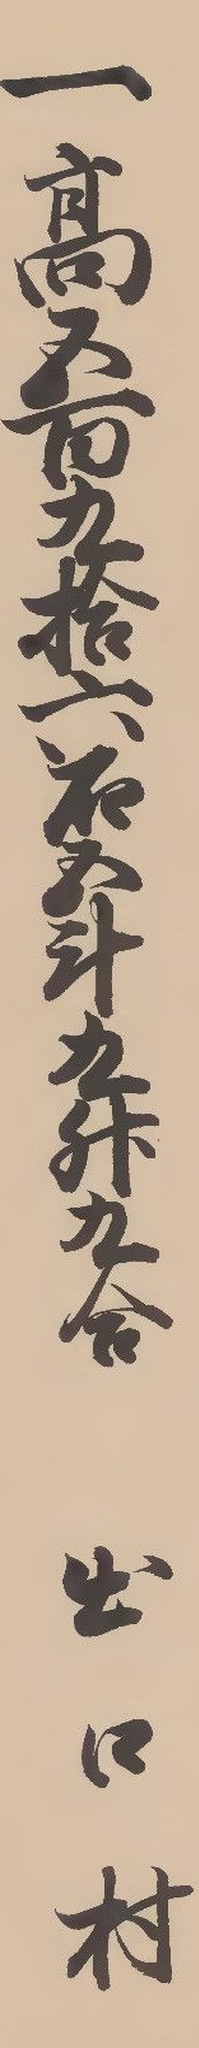一高五百九拾六石五斗九升九合出口村
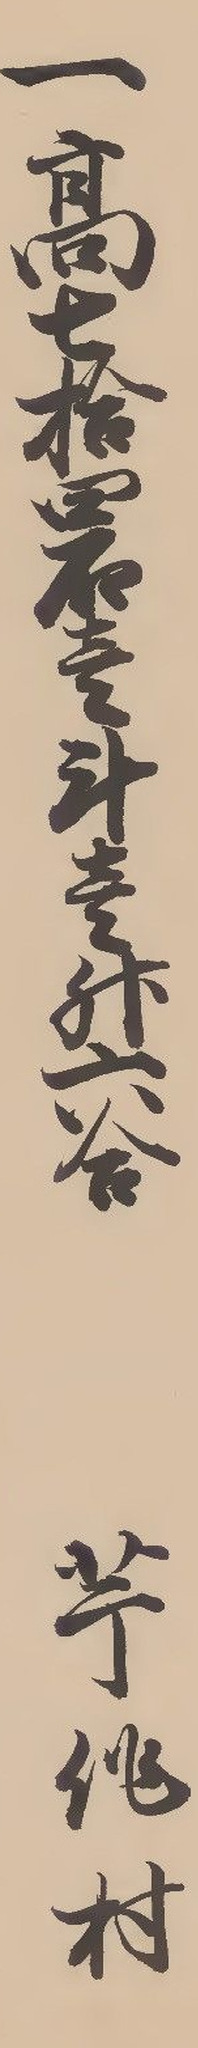一高七拾四石壱斗壱升六合芋作村
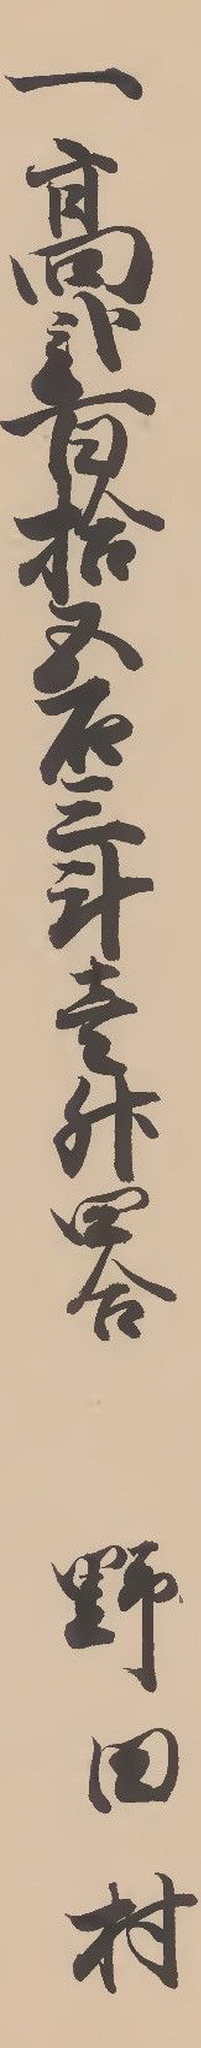一高弐百拾五石三斗壱升四合野田村
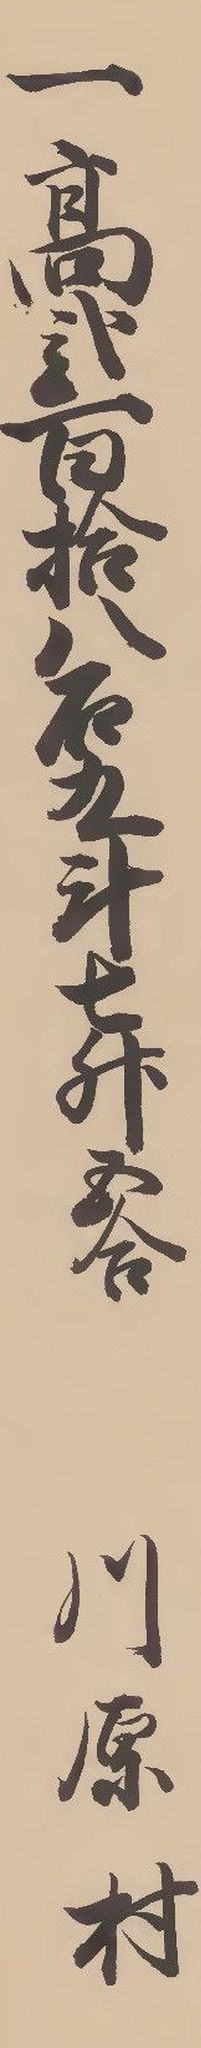一高弐百拾八石九斗七升五合川原村

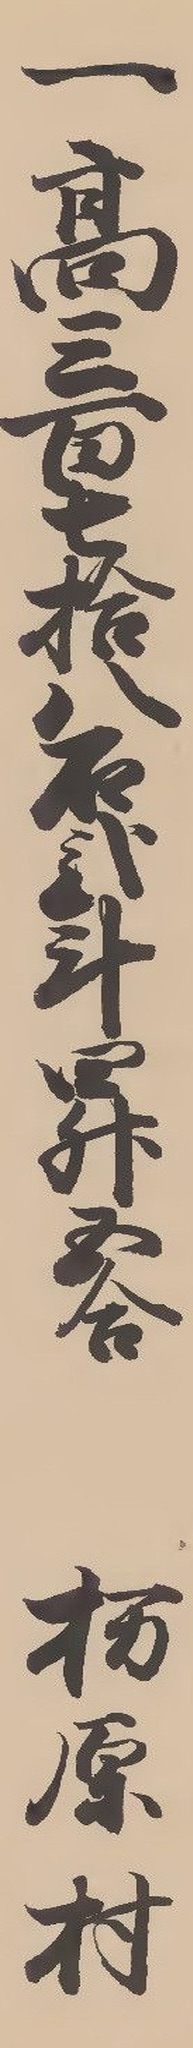一高三百七拾八石弐斗四升五合栃原村
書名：豊後国郷帳
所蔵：国立公文書館 National Archives of Japan
